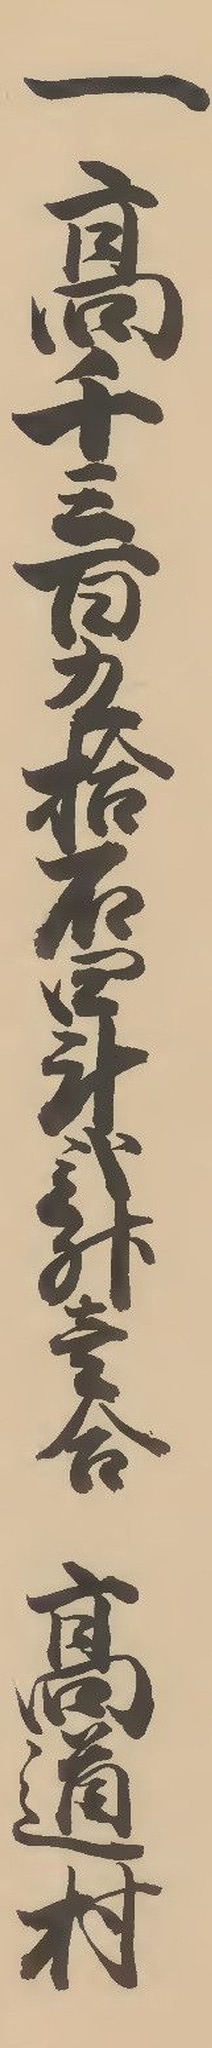一髙千三百九拾石四斗弐升壱合高道村
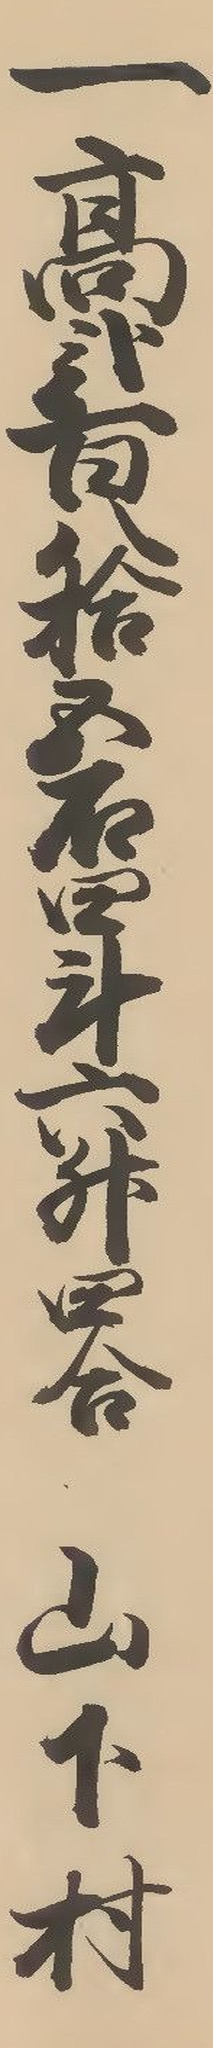一髙弐百八拾五石四斗六升四合山下村
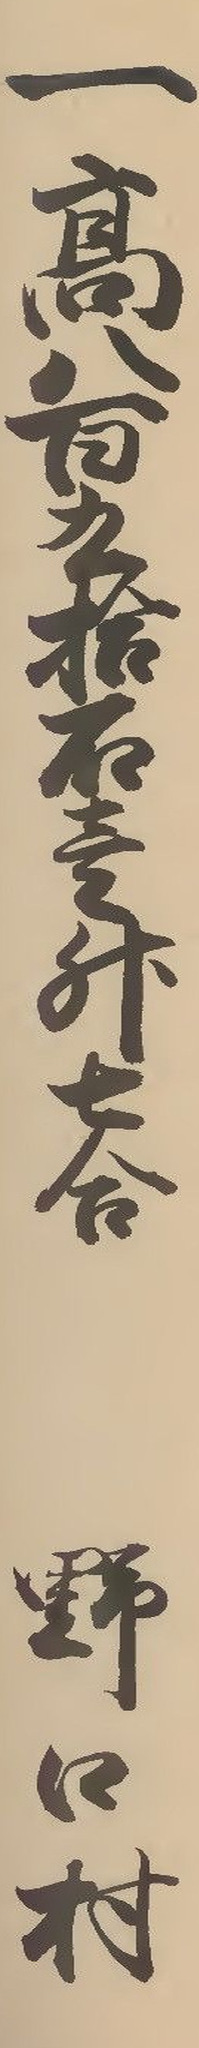一髙八百九拾石壱升七合野口村
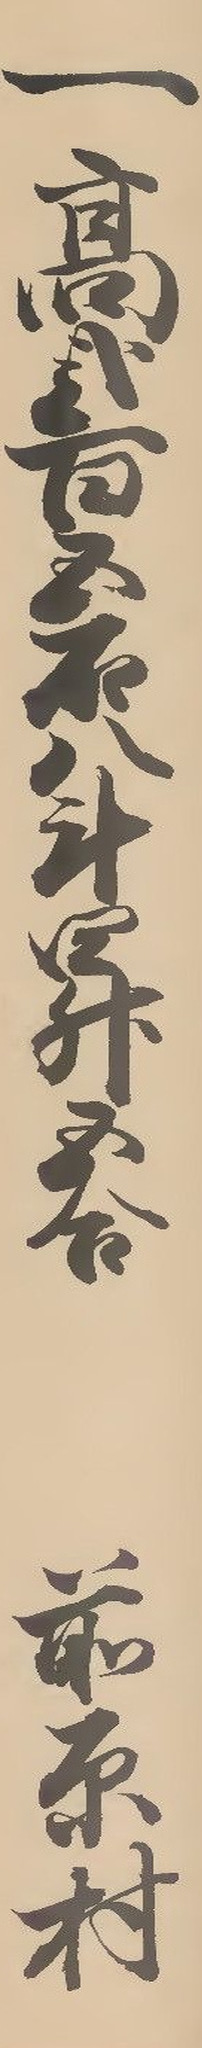一髙弐百五石八斗四升五合前原村
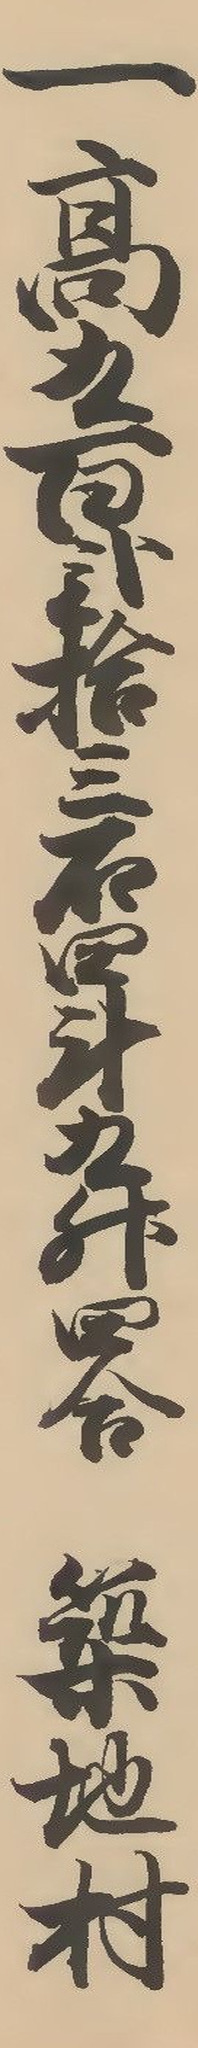一髙九百弐拾三石四斗九升四合築地村
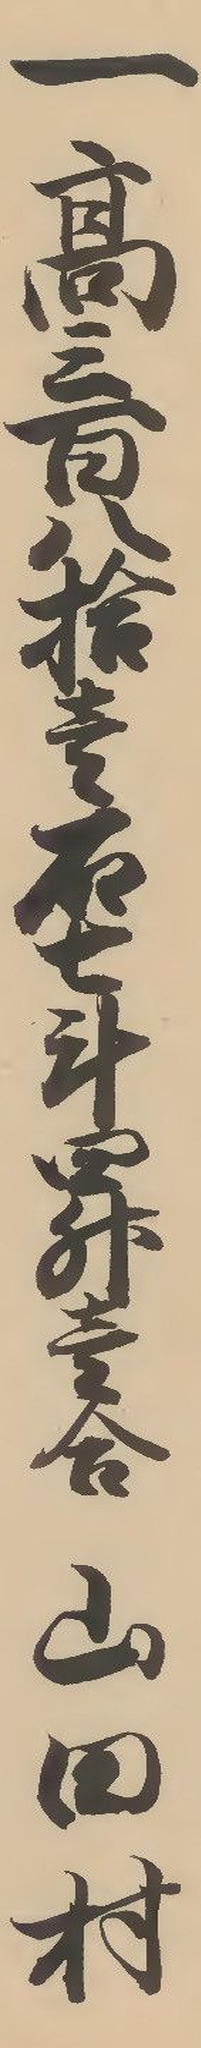一髙三百八拾壱石七斗四升壱合山田村
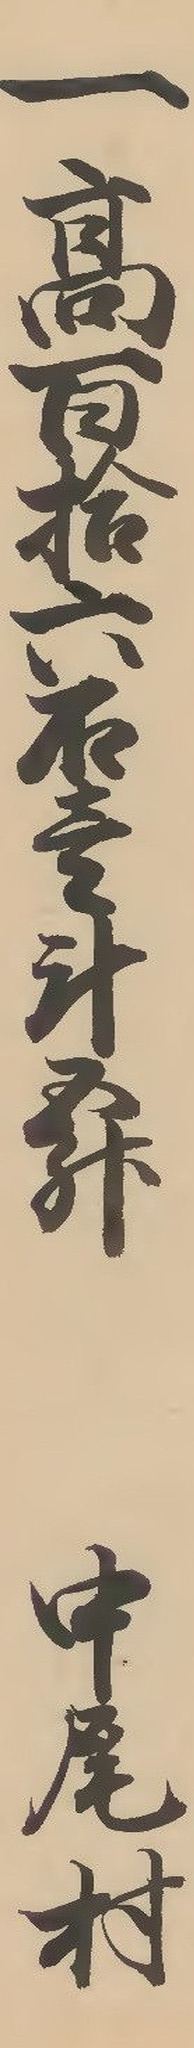一髙百拾六石壱斗五升中尾村

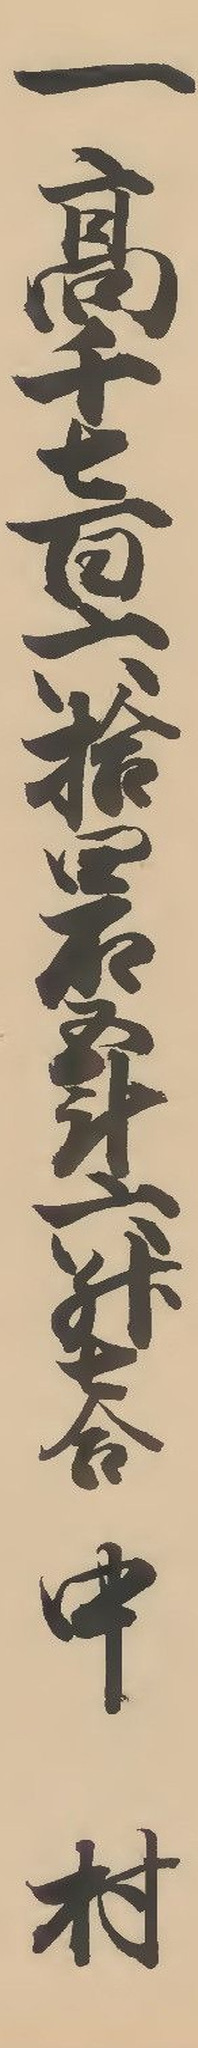一髙千七百六拾四石五斗六升七合中村
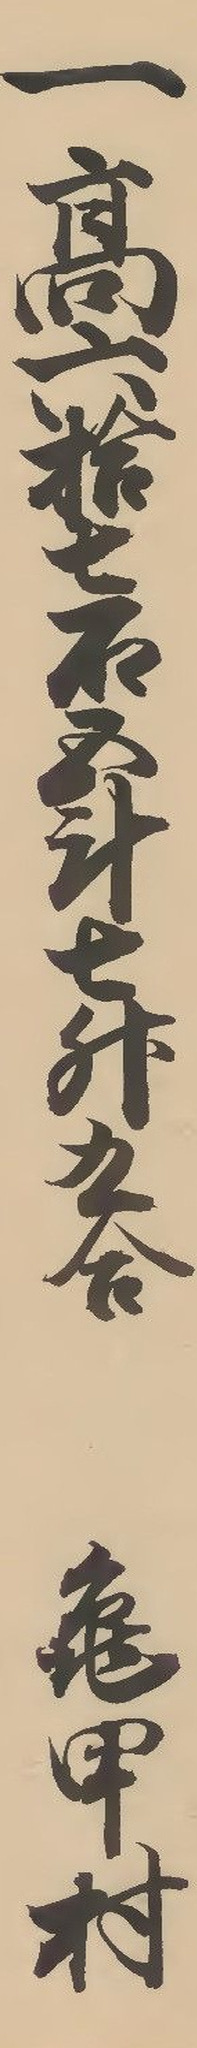一髙六拾七石五斗七升九合龜甲村
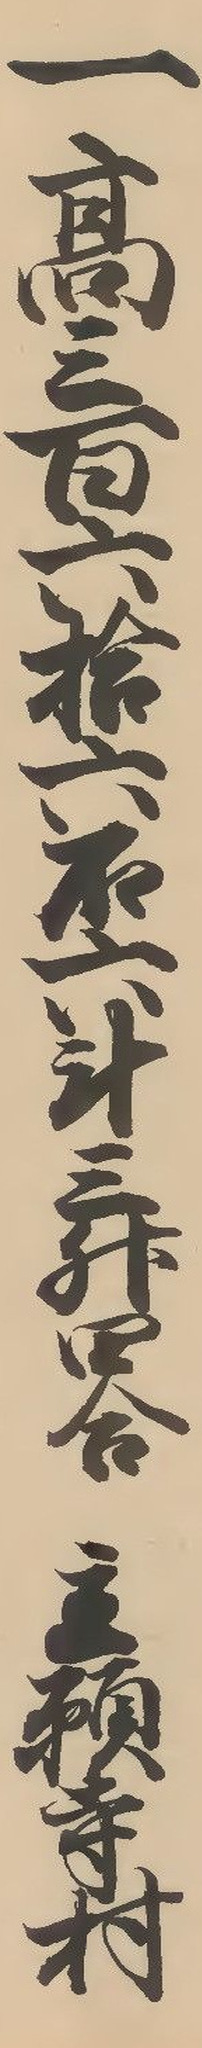一髙三百六拾六石六斗三升四合立願寺村
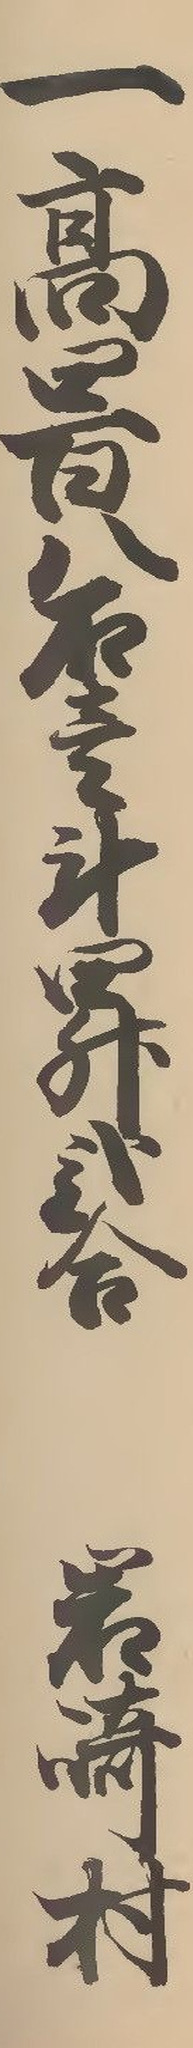一髙四百八石壱斗四升弐合岩崎村
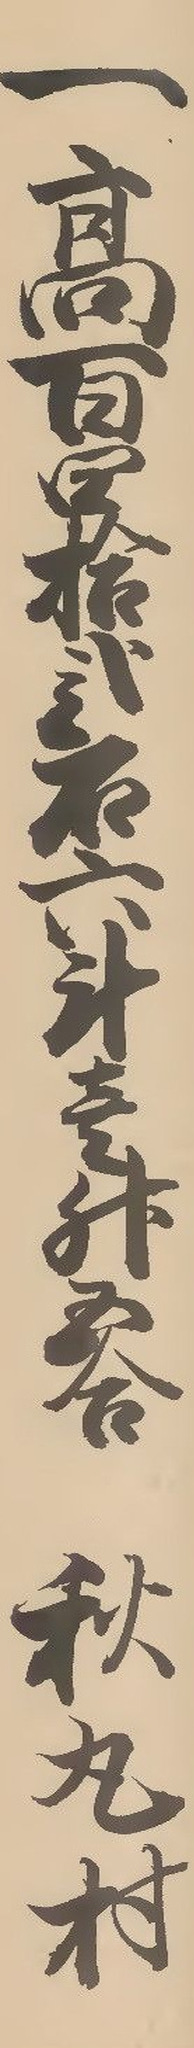一髙百四拾弐石六斗壱升五合秋丸村
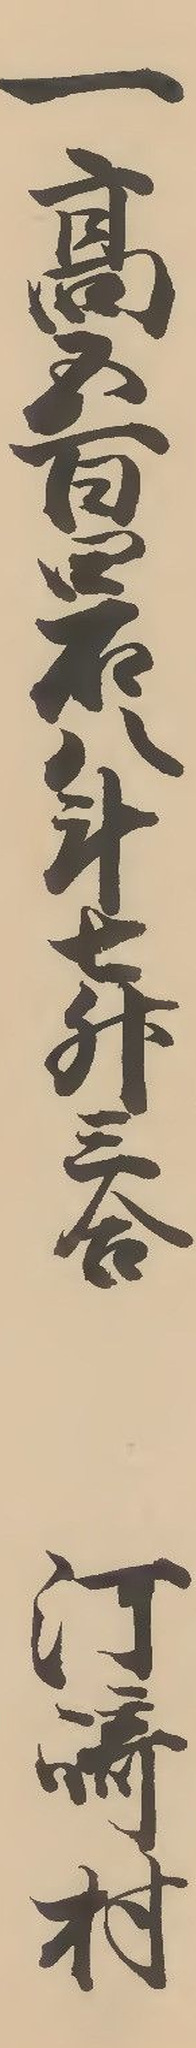一髙五百四石八斗七升三合河崎村
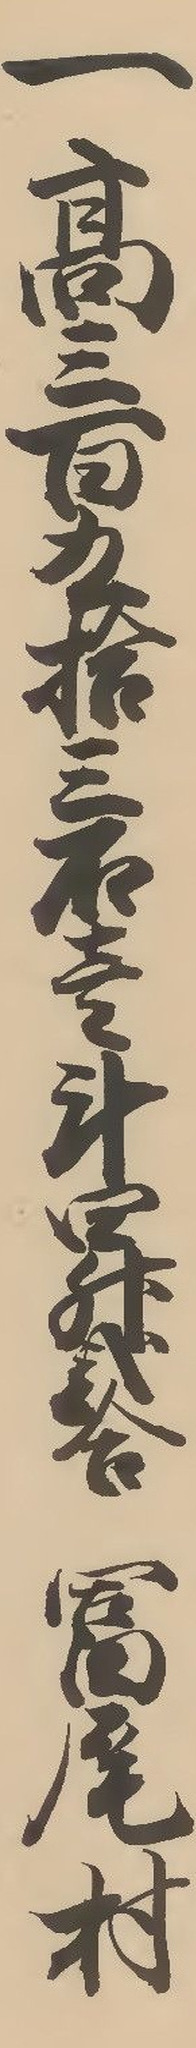一髙三百九拾三石壱斗四升弐合冨尾村
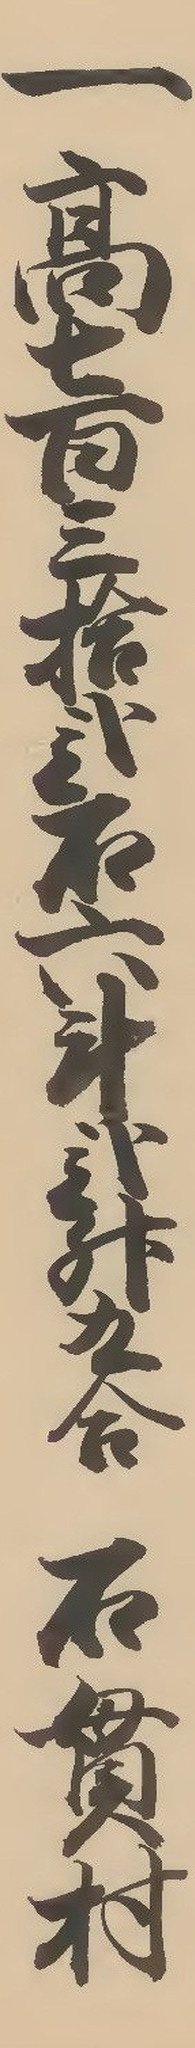一髙七百三拾弐石六斗弐升九合石貫村

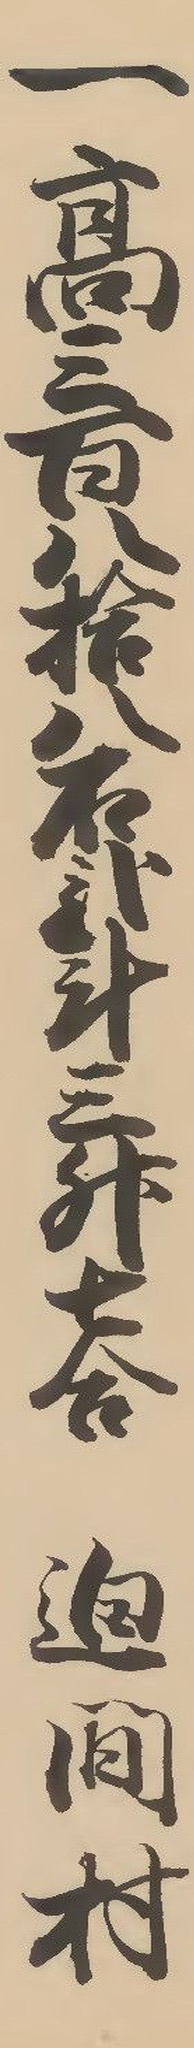一髙三百八拾八石弐斗三升七合迫間村
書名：肥後国郷帳
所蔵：国立公文書館 National Archives of Japan
